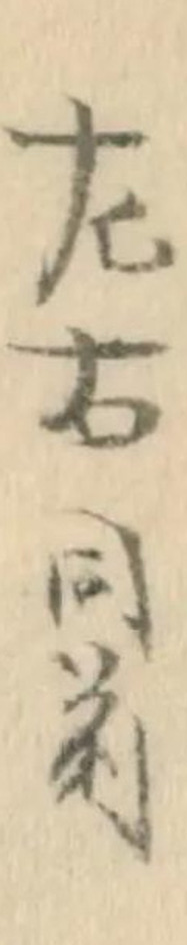左右同前
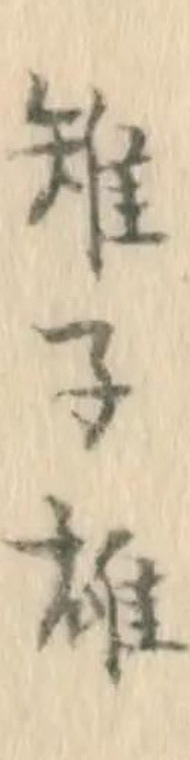雉子雄
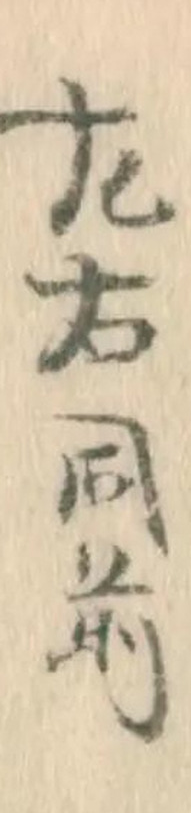左右同前
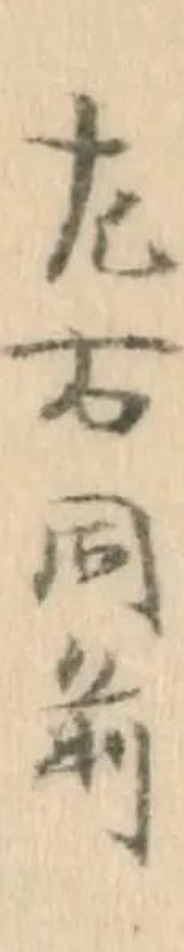左右同前

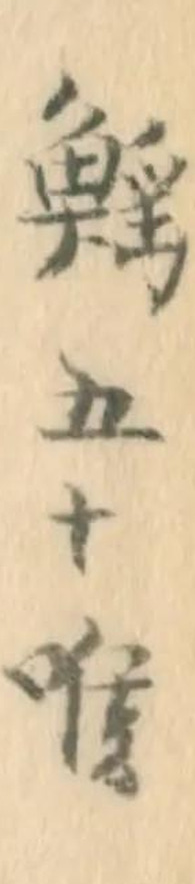鰩五十喉
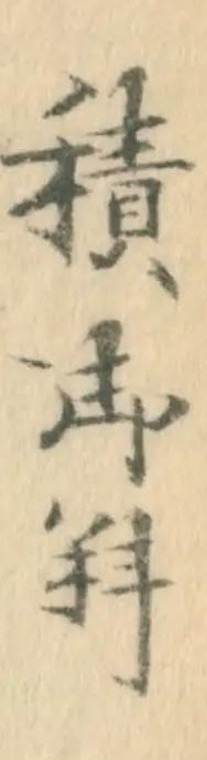積御料
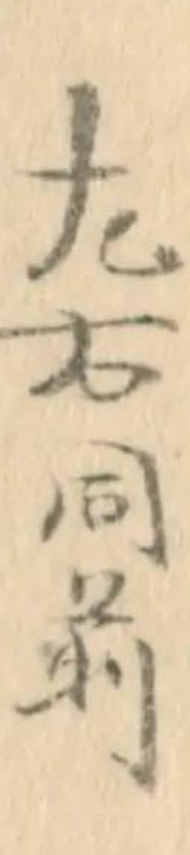左右同前
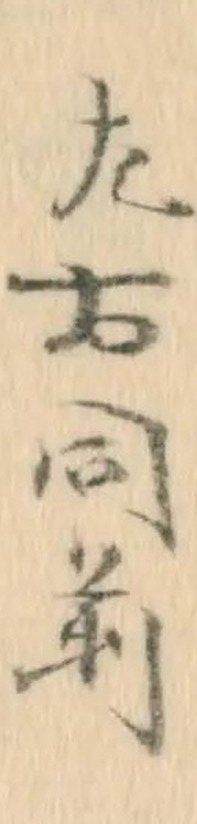左右同前
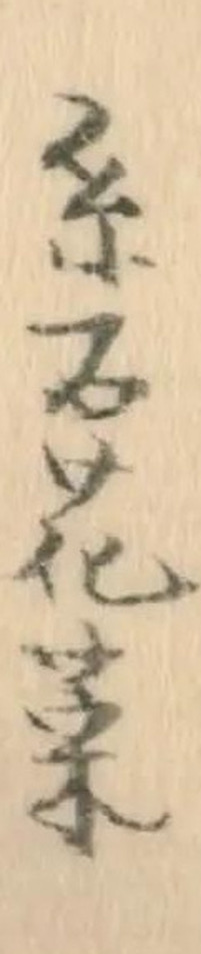糸石花菜
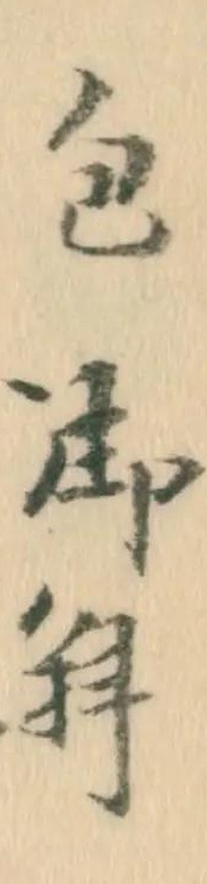包御料
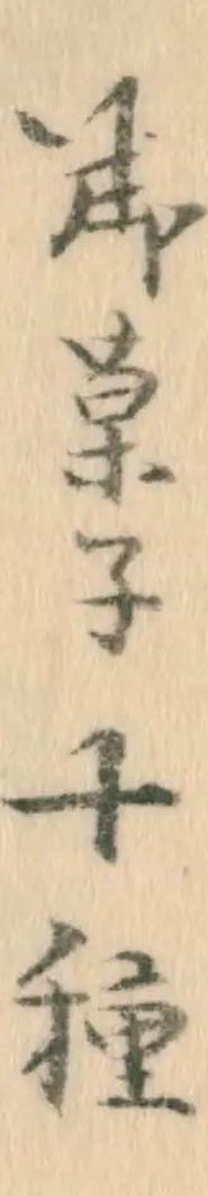御菓子十種
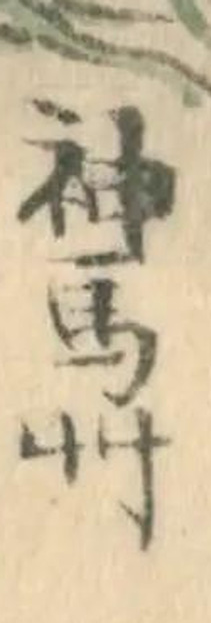神馬草

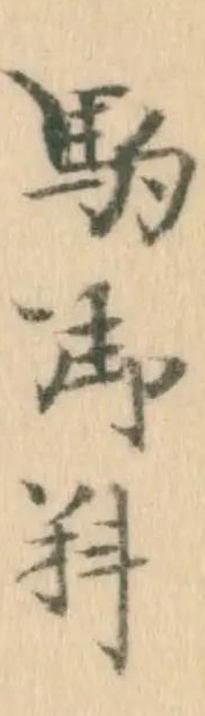駒御料
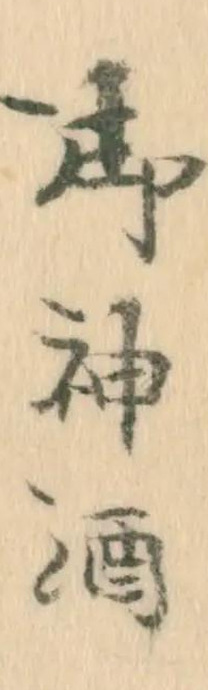御神酒
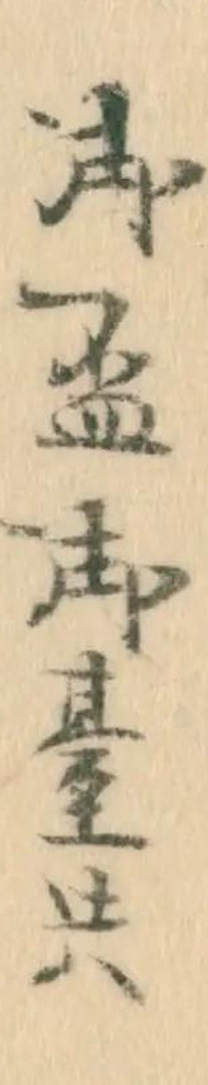御盃御台共
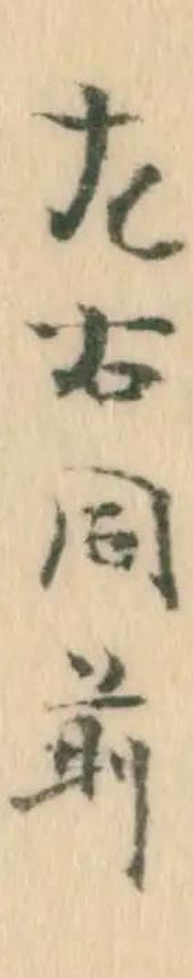左右同前
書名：葵御祭供進之神饌諸品色目書
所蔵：国立国会図書館 National Diet Library, JAPAN
